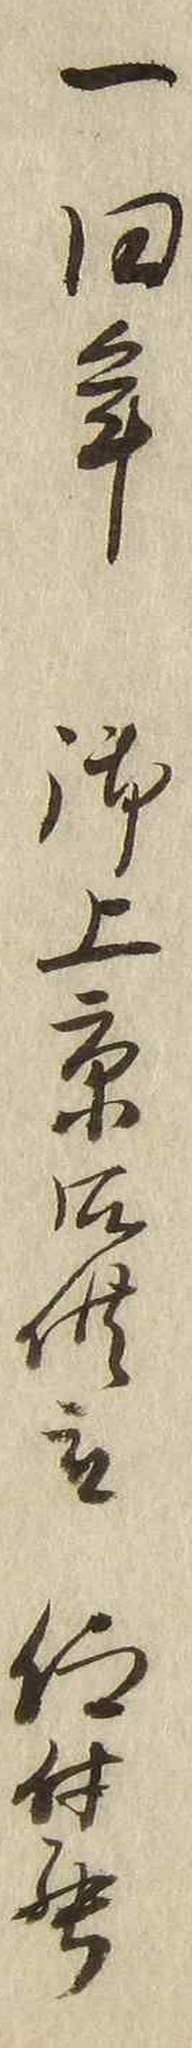一同年御上京御供被仰付罷

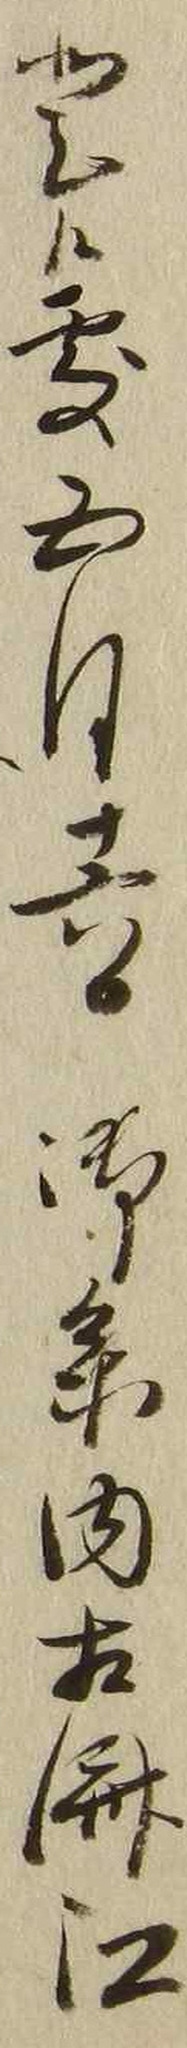登候処五月十六日御参内相済江
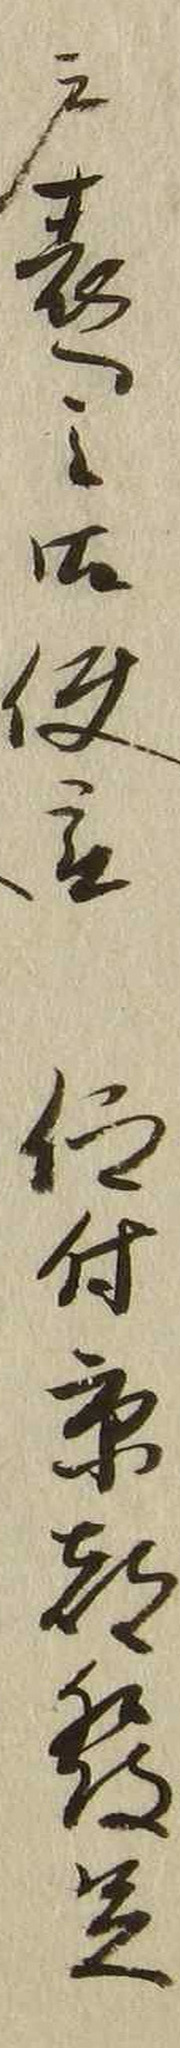戸表へ之御使被仰付京都発足
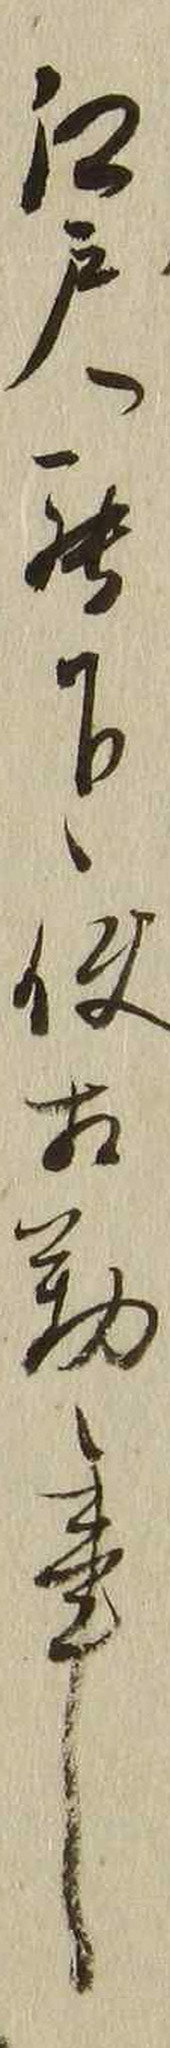江戸へ罷下候使相勤候事
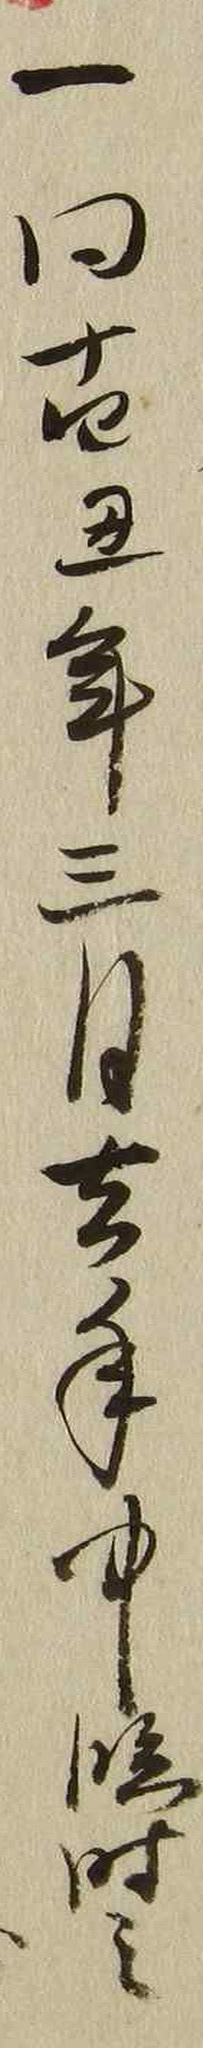一同十四丑年三月去年中臨時之
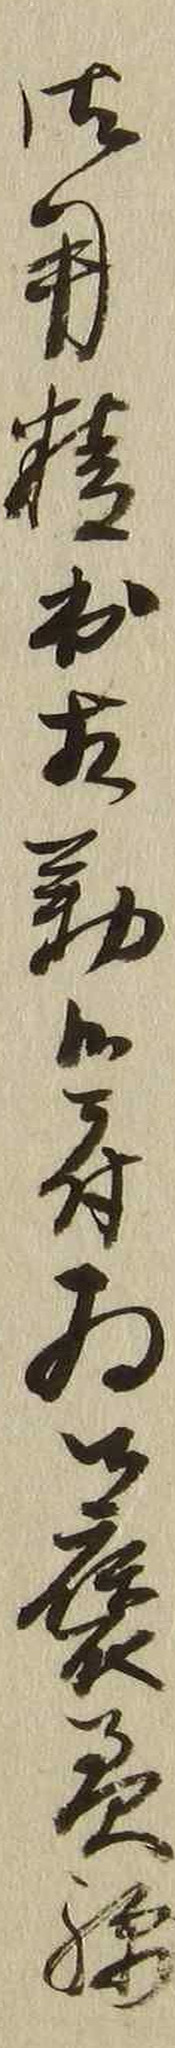御用精出相勤候ニ付為御褒美綿
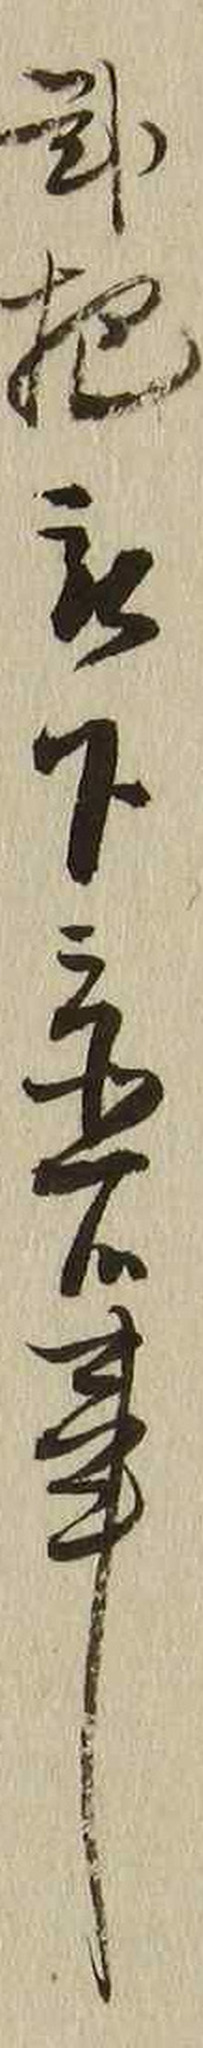弐把被下置候事
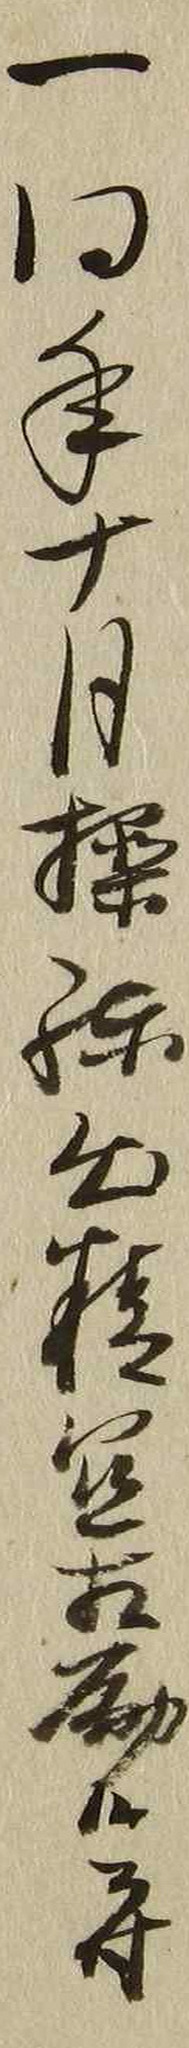一同年十月操練出精宜相励候ニ付
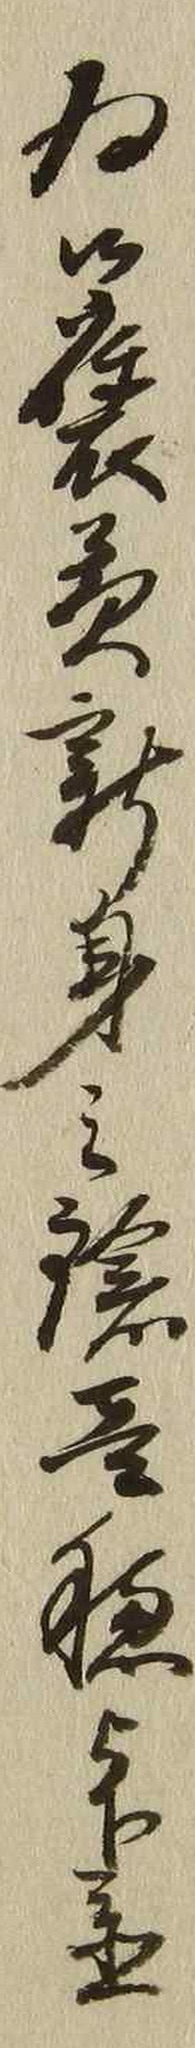為御褒美新身之鎗壱穂被下置
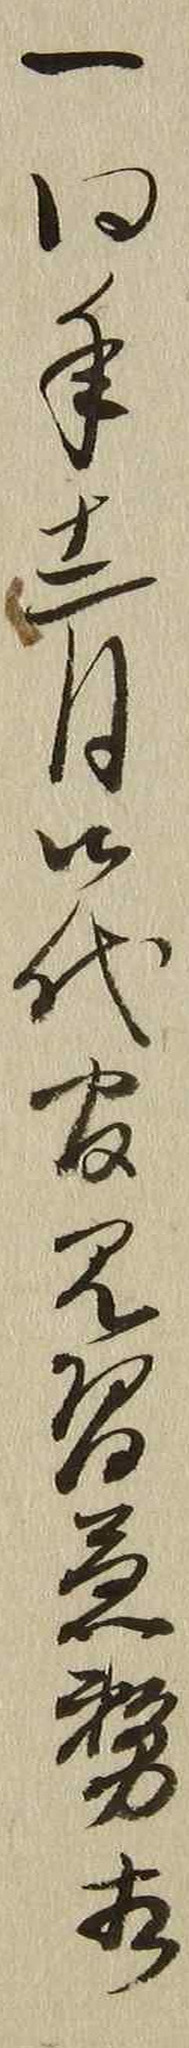一同年十二月御代官見習兼務相
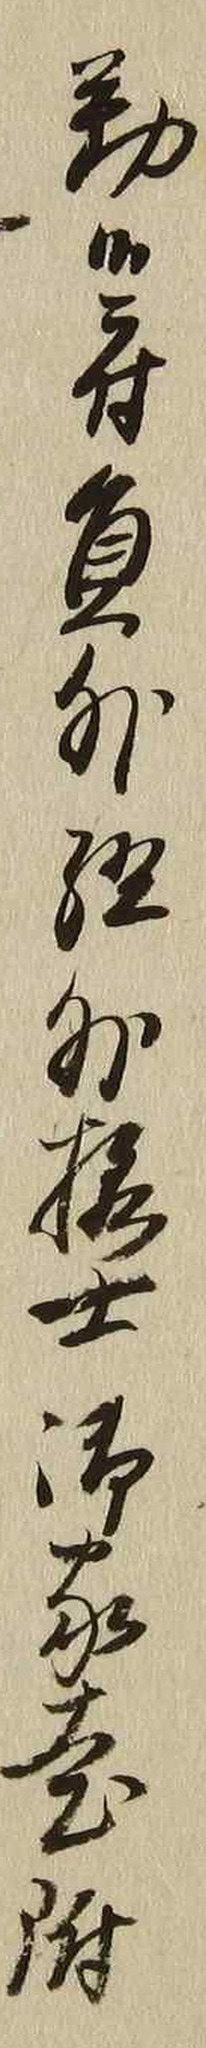勤候ニ付員外組外様士御家遠附
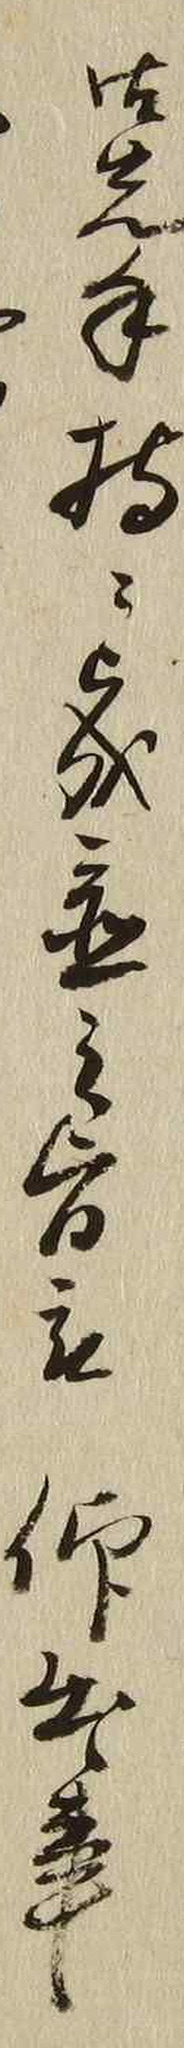御先手持ニ被成置之旨被仰出候事
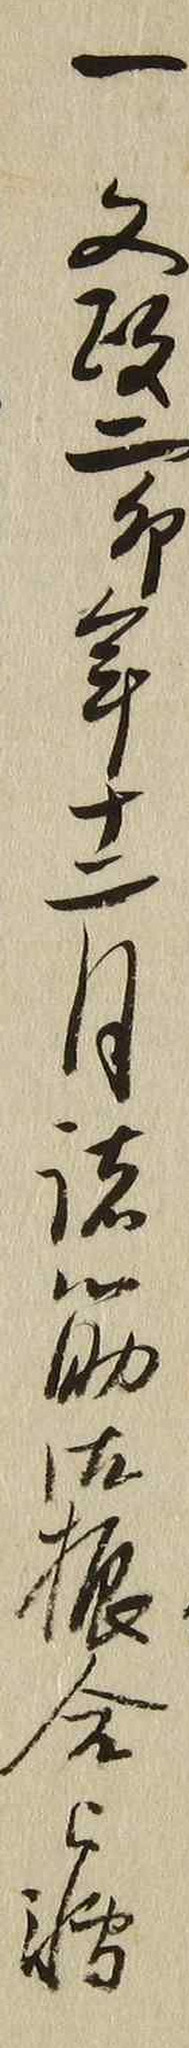一文政二卯年十二月諸筋御振合被転
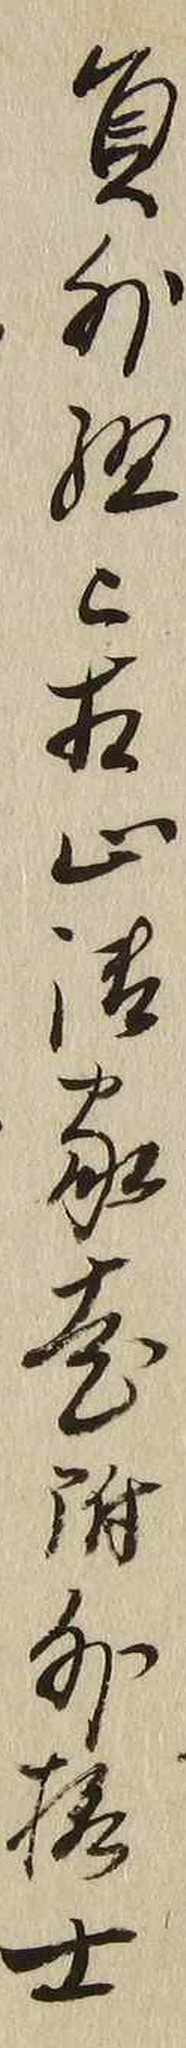員外組被相止御家老附外様士
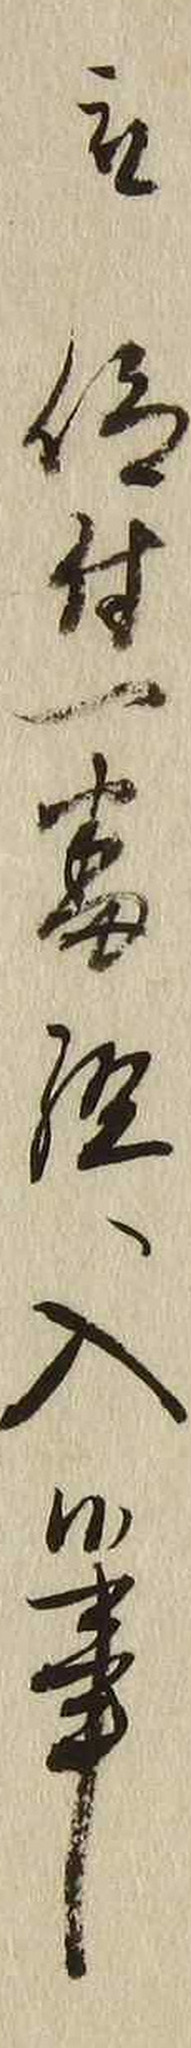被仰付一番組へ入候事
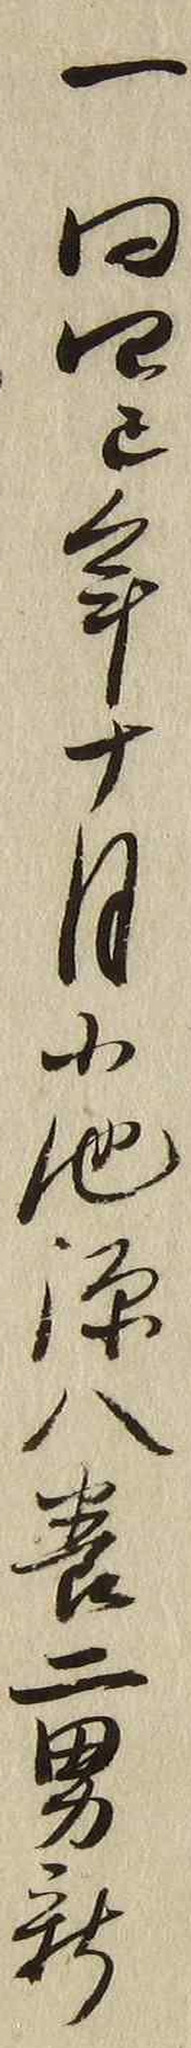一同四巳年十月小池源八養二男新
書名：諸士系譜　巻之348　も之部4
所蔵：会津若松市立会津図書館
